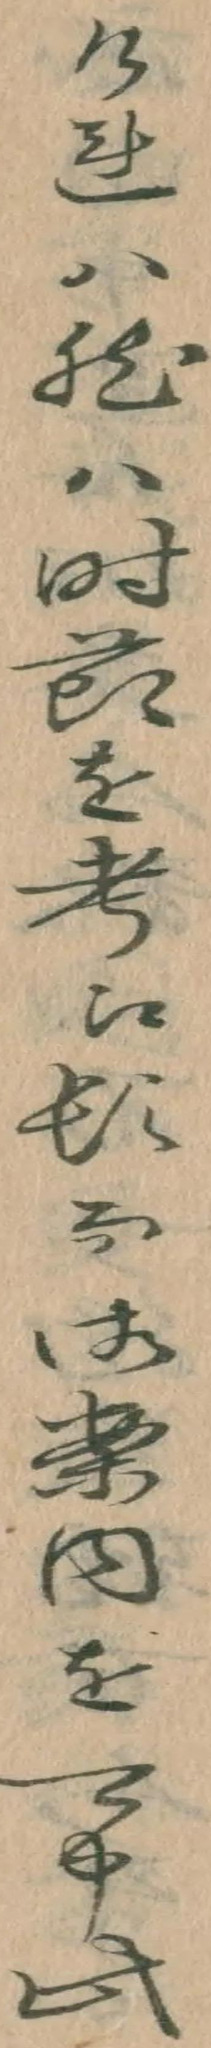け連は然は時節を考江頓而御案内を可申此
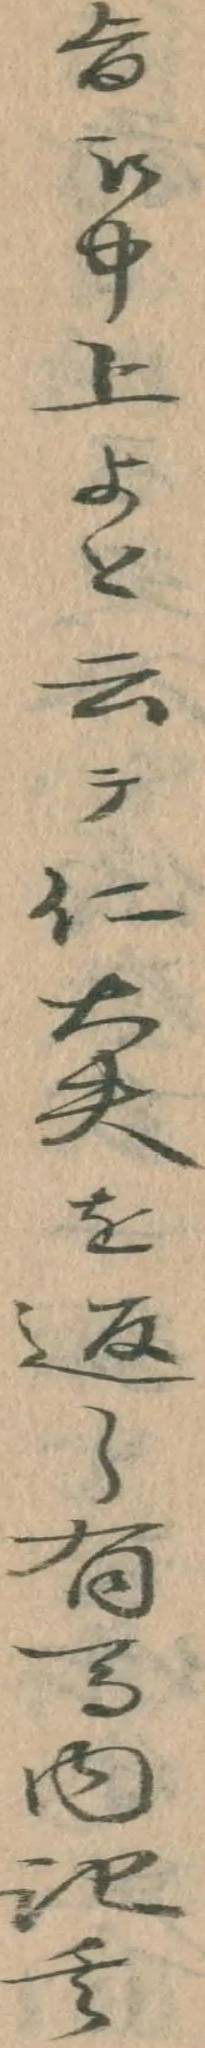旨被申上よと云て仁太夫を返し有馬内記其
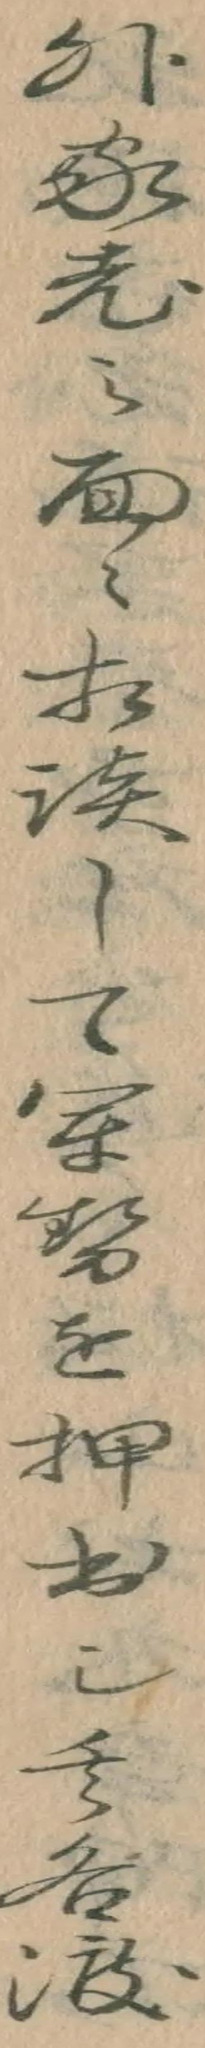外家老之面々相談して軍勢を押出し其各渡
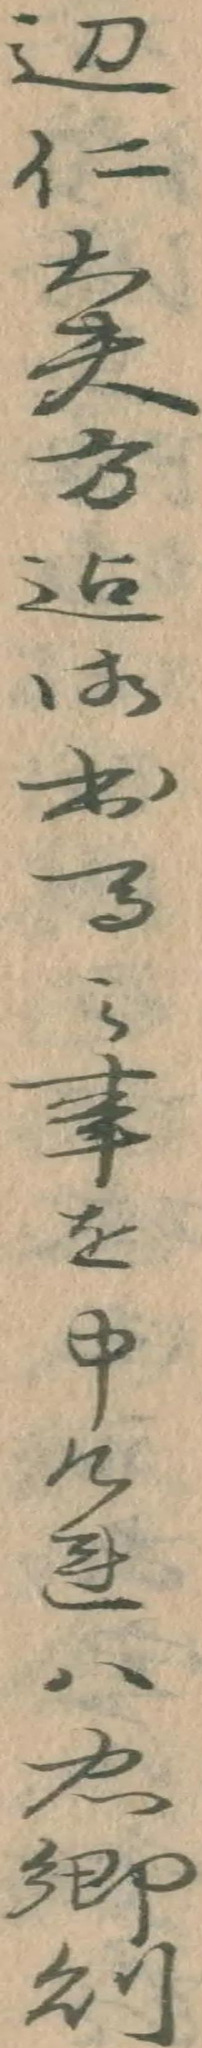辺仁太夫方迄御出馬之事を申け連は忠郷則
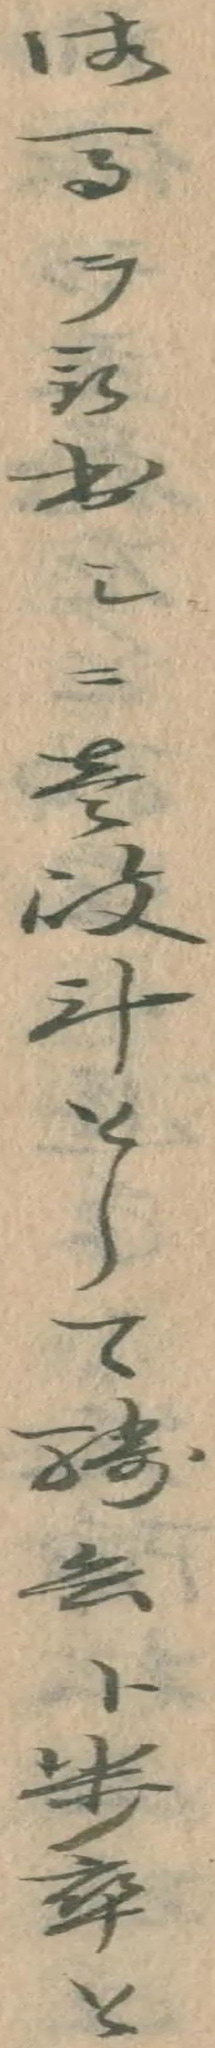御馬を被出しに壱岐斗として騎兵と歩卒と
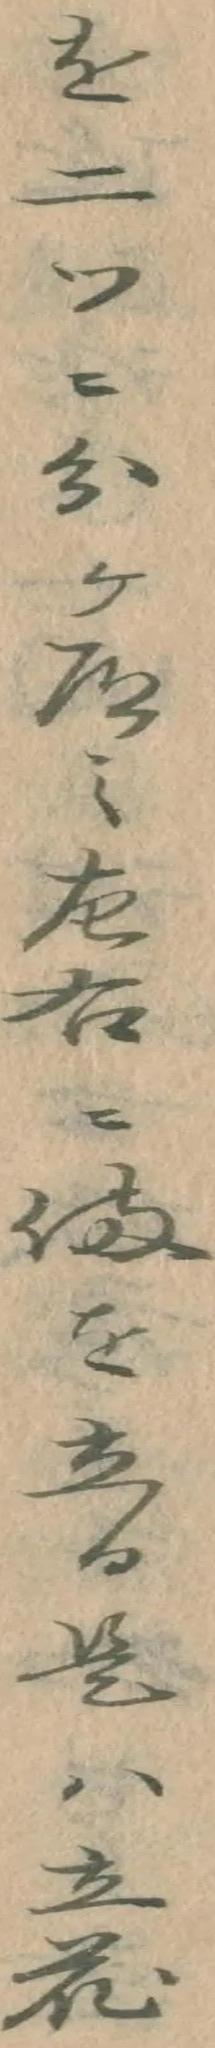を二つに分け道之左右に備を立る是は立花
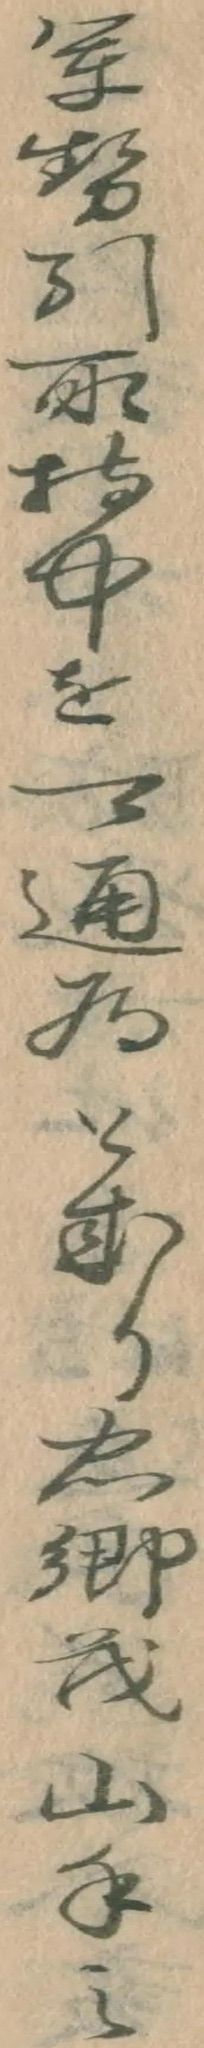軍勢引取持中を可通為と成り忠郷茂山手之
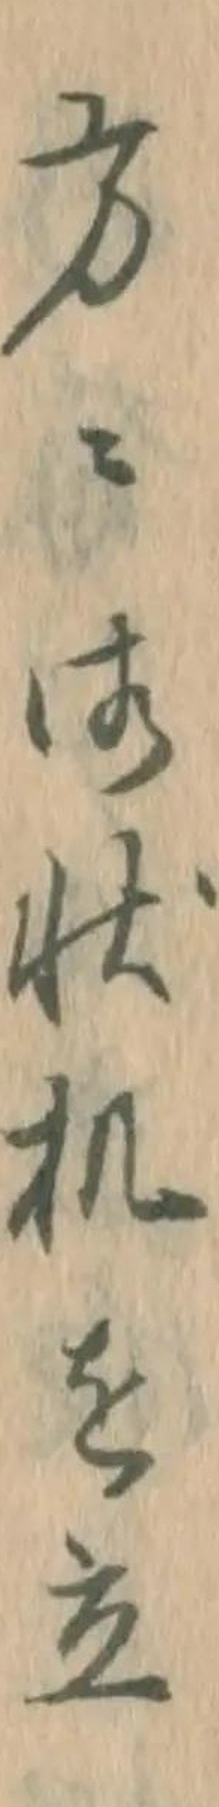方に御状机を立
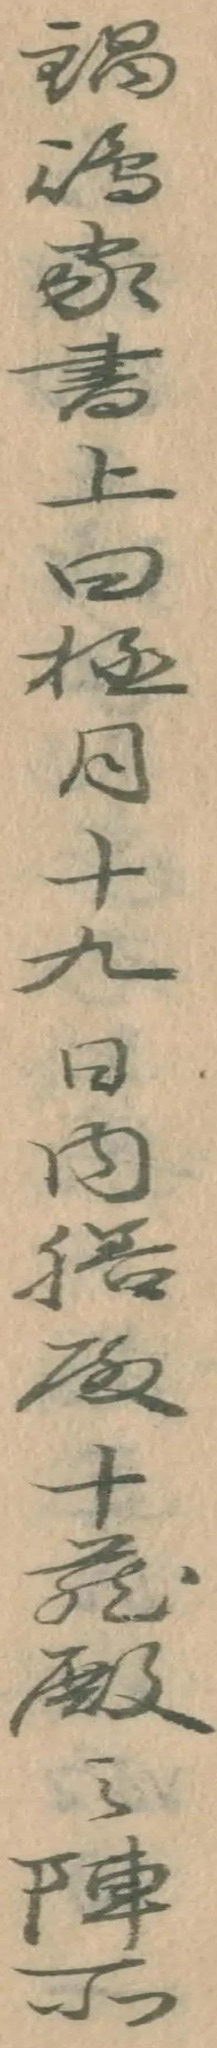鍋島家書上曰極月十九日内膳殿十蔵殿之陣所

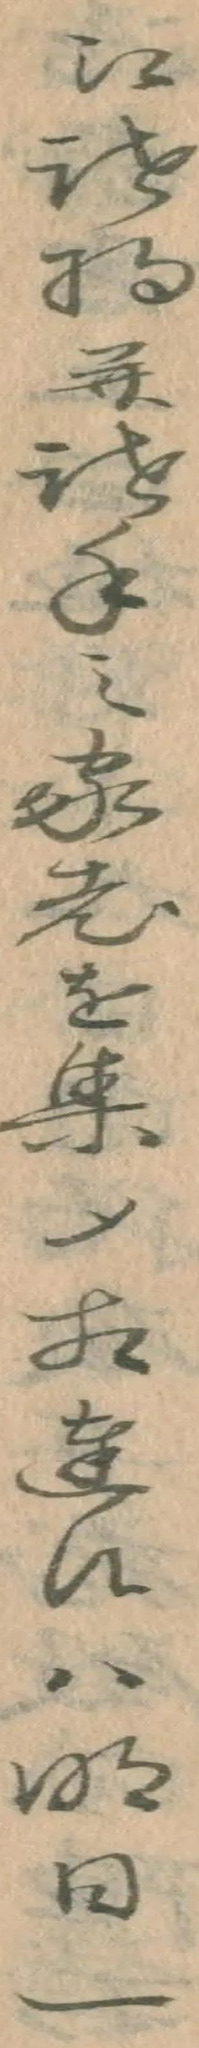江諸将幷諸手之家老を集め相達候は明日一
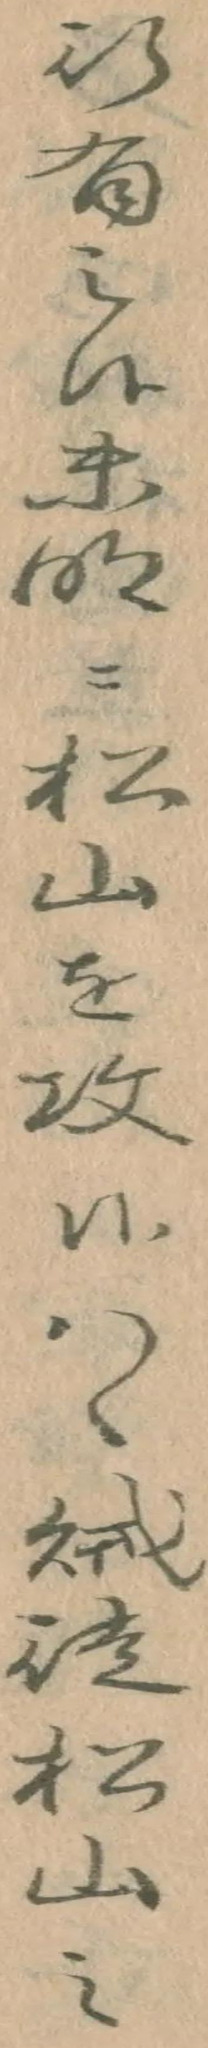行有之候未明に松山を攻候はゝ賊徒松山之
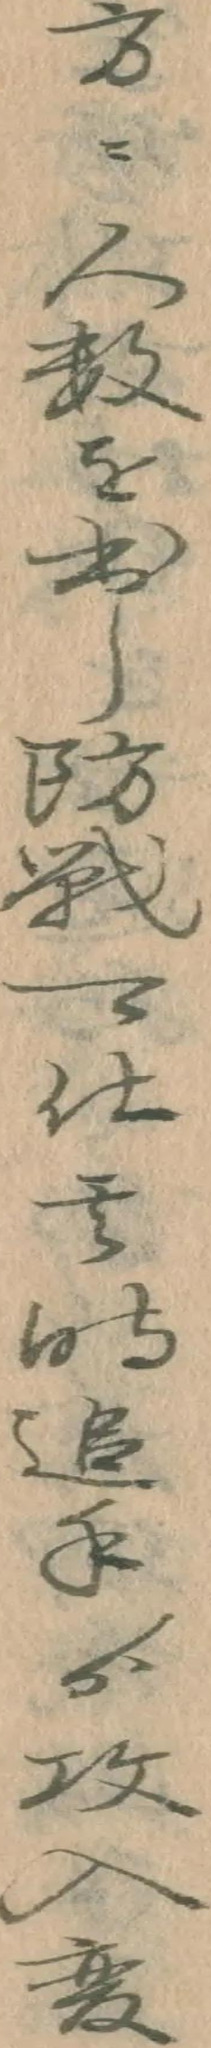方に人数を出し防戦可仕其時追手ゟ攻入変
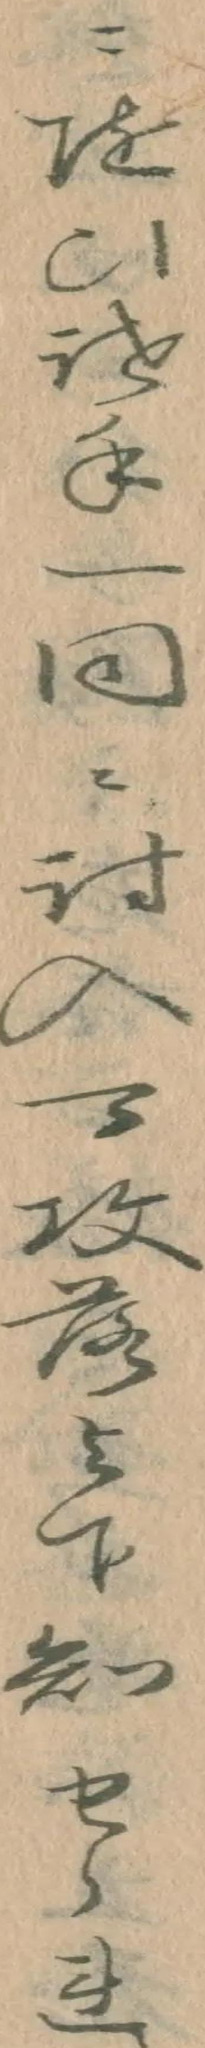に随ひ諸手一同に討入可攻落与下知せら連
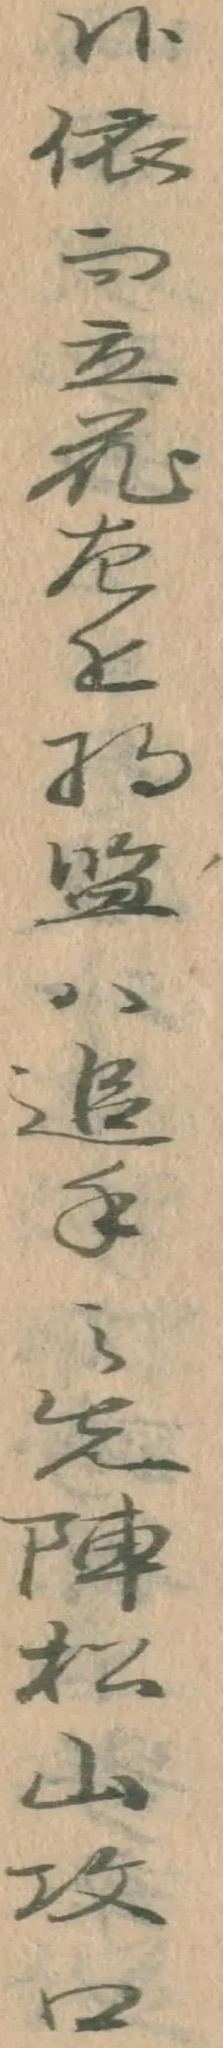候依而立花左近将監は追手之先陣松山攻口
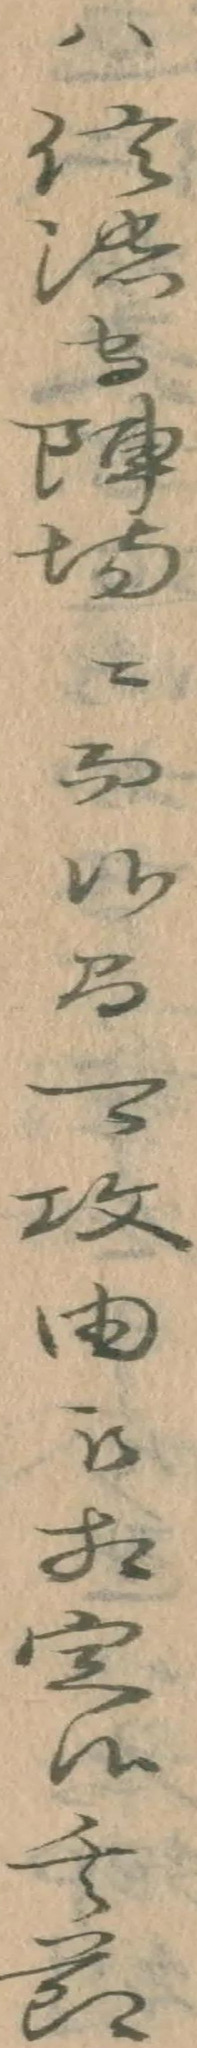は信濃守陣場に而候間可攻由被相定候其節
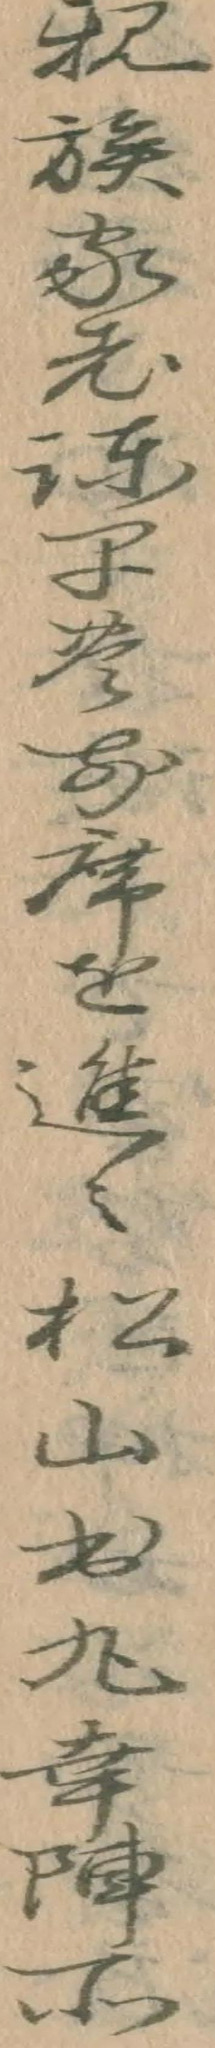親族家老諌早豊前席を進み松山出丸幸陣所
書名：切支丹御退治記 49巻. [4]
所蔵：国立国会図書館 National Diet Library, JAPAN
